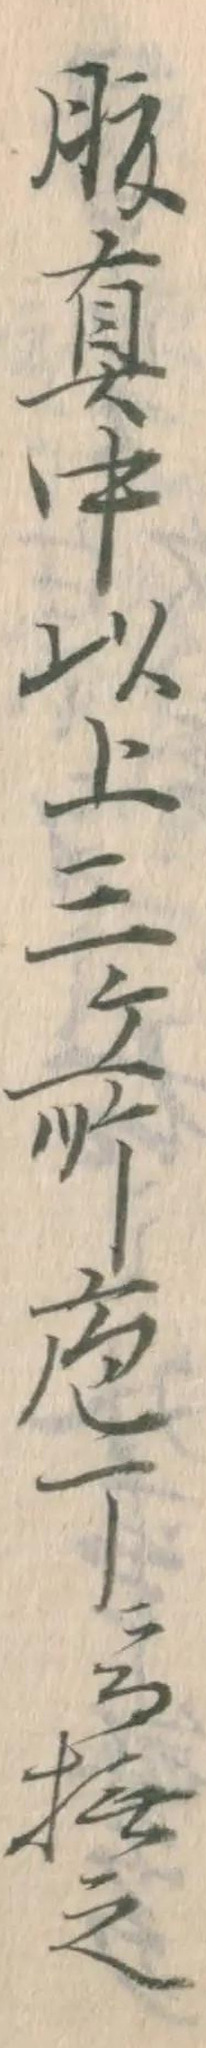腹真中以上三ヶ所包丁に而撫之
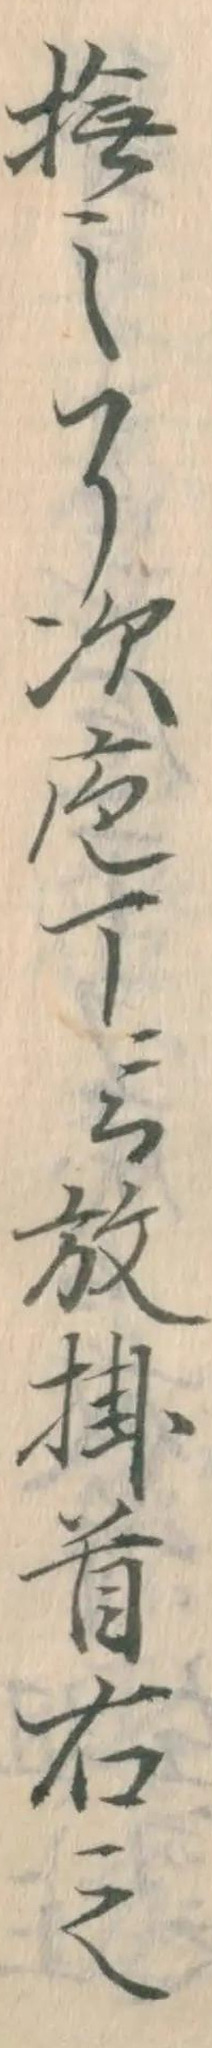撫之了次庖丁に而放掛首右之

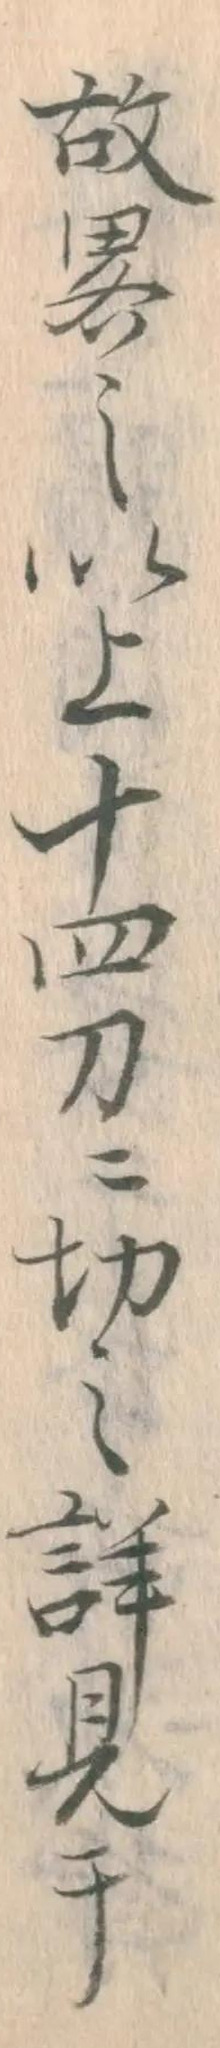故略之以上十四刀に切之詳見于
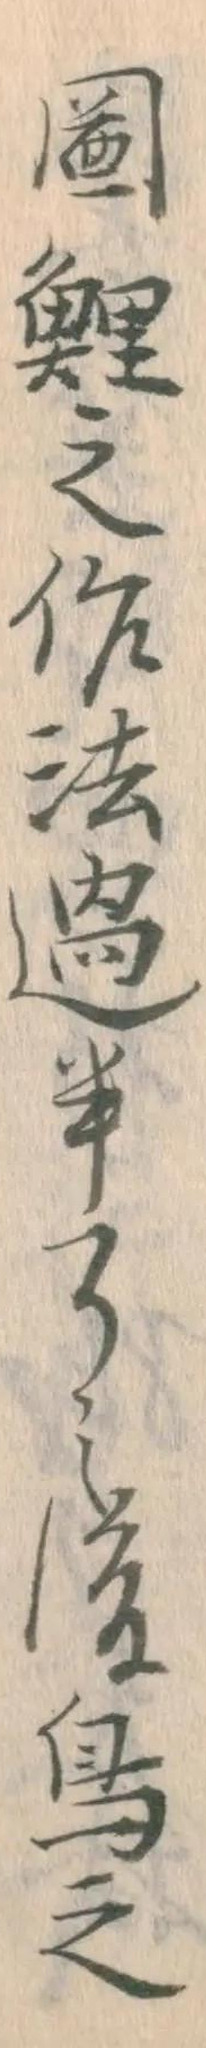図鯉之作法過半了之後鳥之
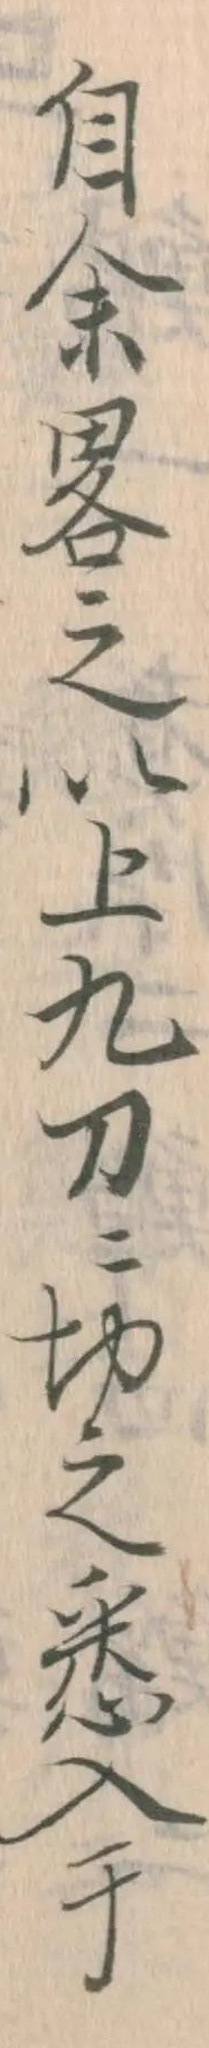自余略之以上九刀に切之悉入干
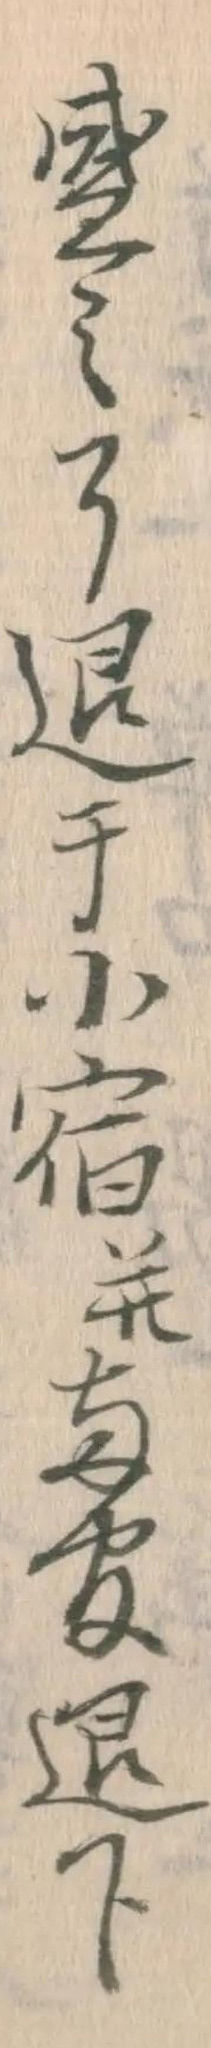盛之了退于小宿并両官退下
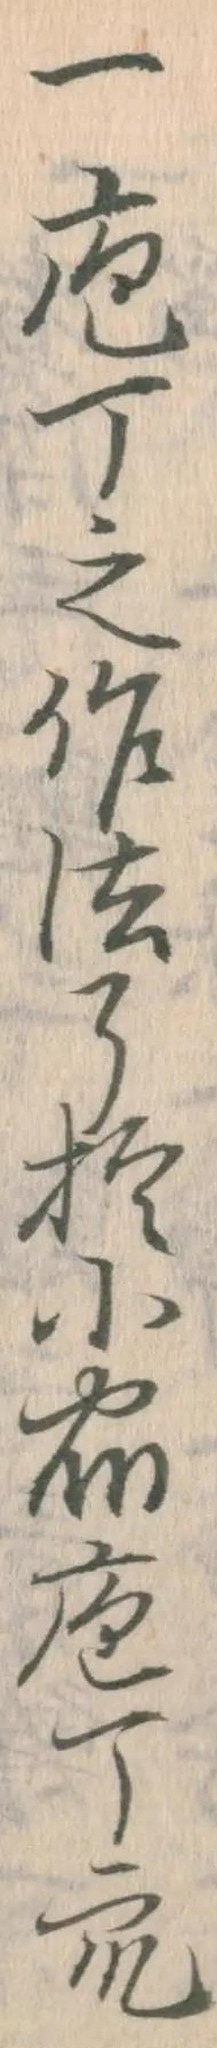一庖丁之作法了於小宿庖丁衆
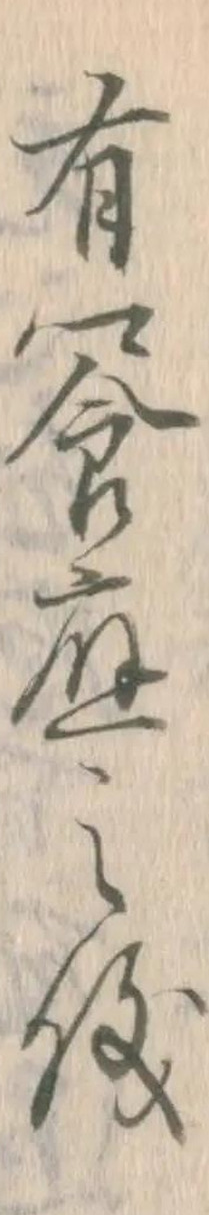有饗応之儀
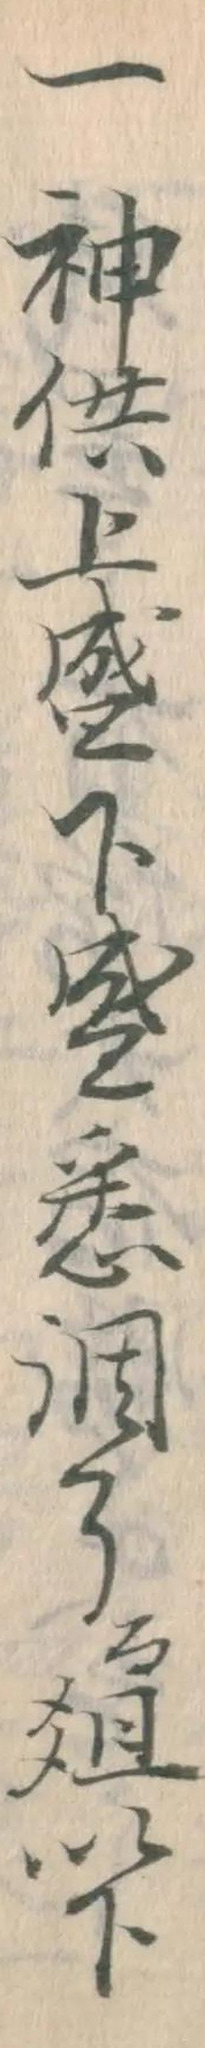一神供上盛下盛悉調了而俎以下
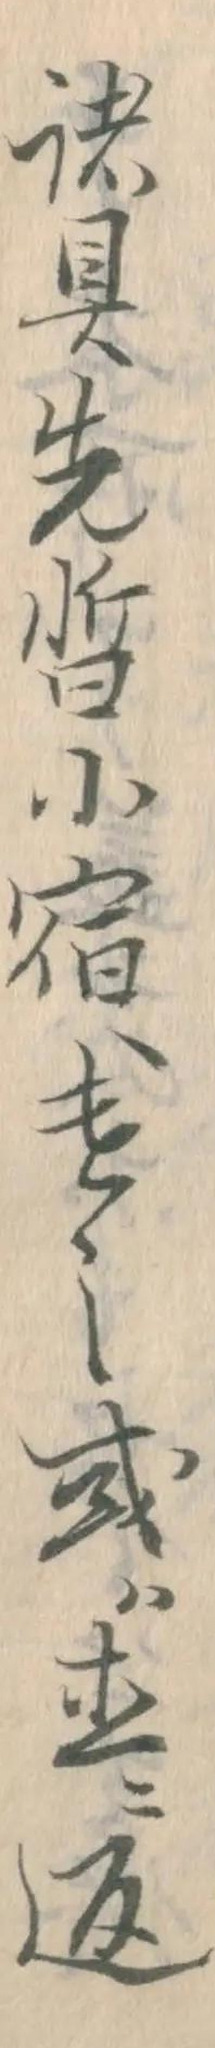諸具先暫小宿へ遣之或は直に返

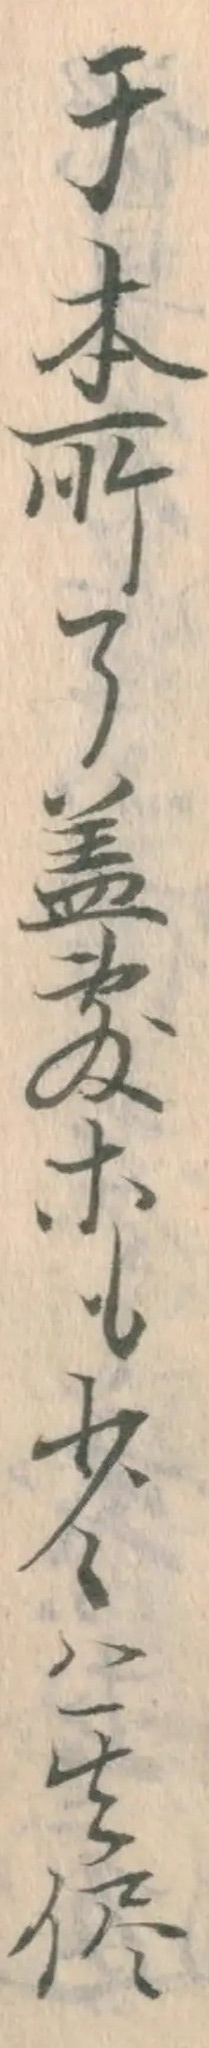干本所了蓋敷等も少々は其侭
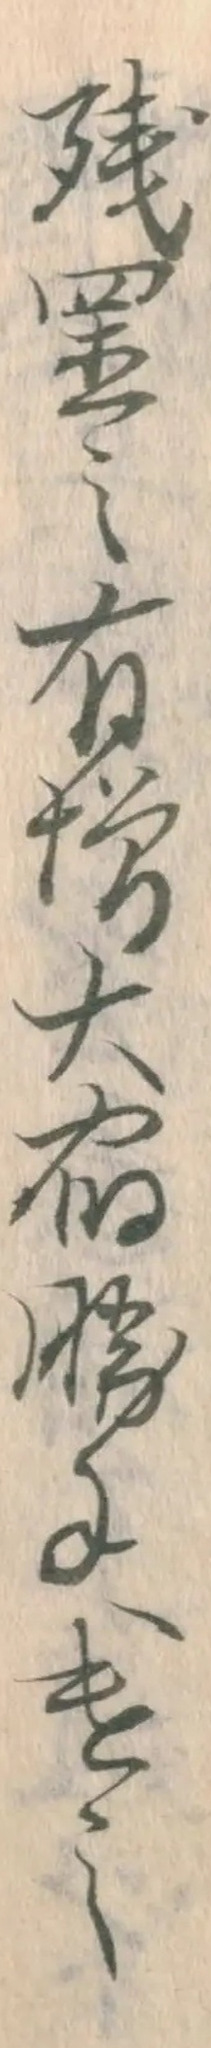残置之有増大宿勝手へ遣之
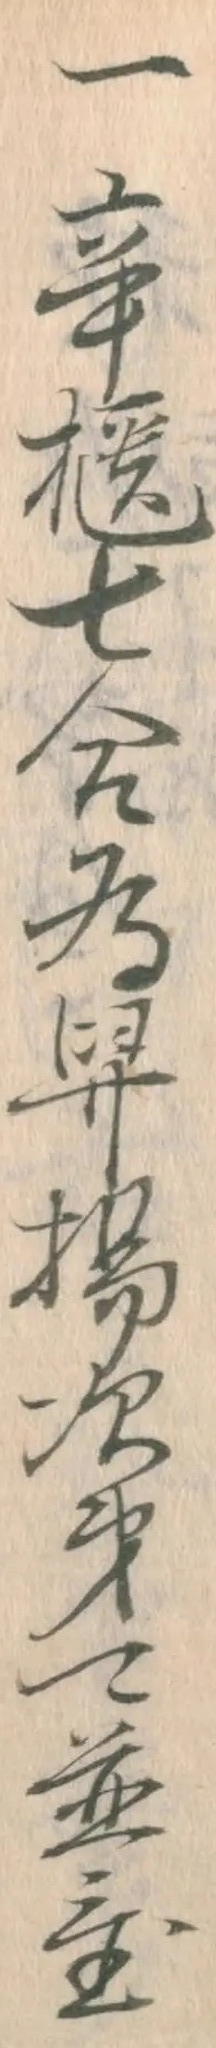一辛櫃七合為舁揚次第可並置
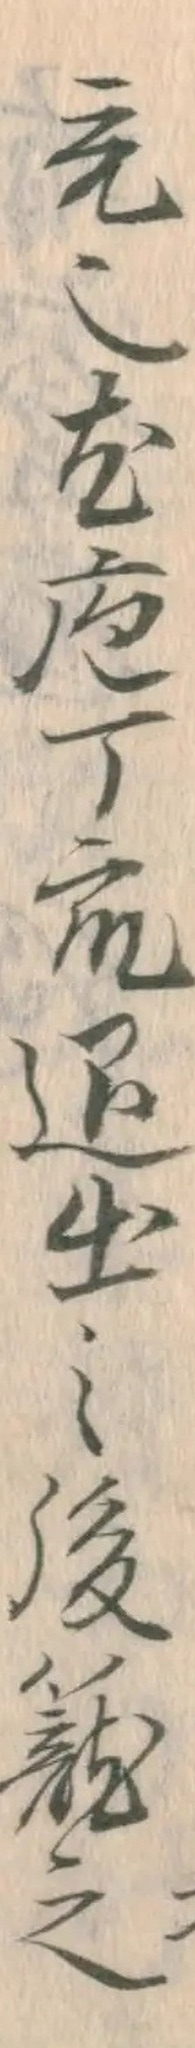充也尤庖丁衆退出之後籠之
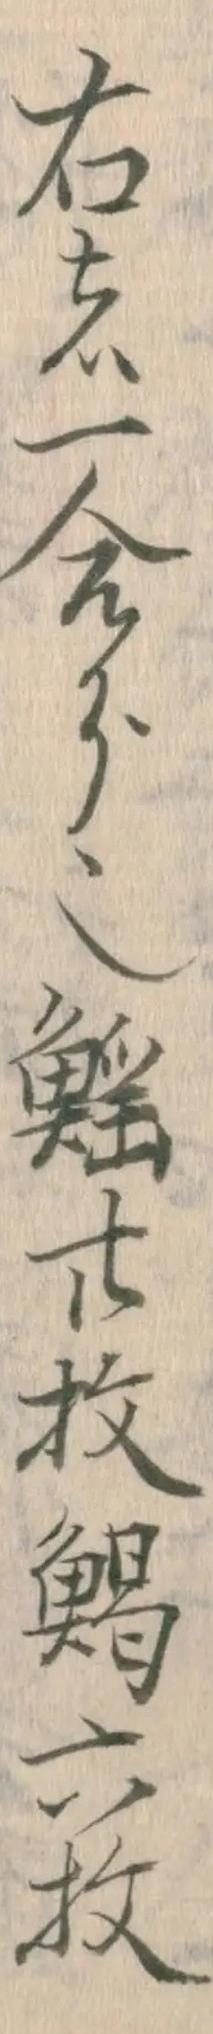右は一合分也鰩廿枚六枚
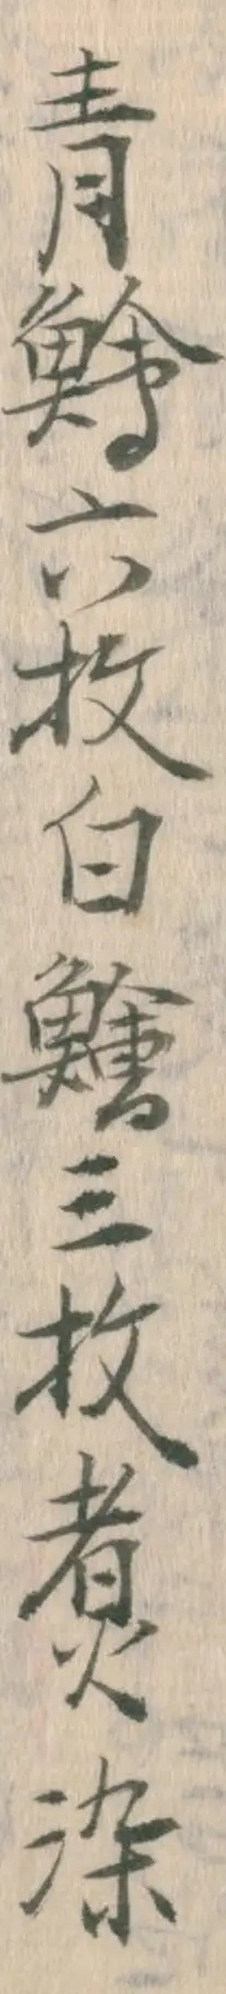青鱠六枚白鱠三枚煮染
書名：賀茂社記録. 第81冊
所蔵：国立国会図書館 National Diet Library, JAPAN
